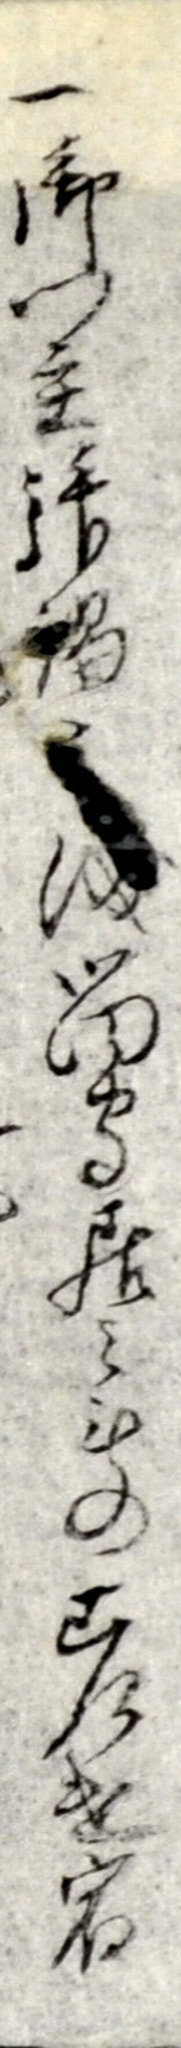一御門主帳場渡留守居之もの差遣宿
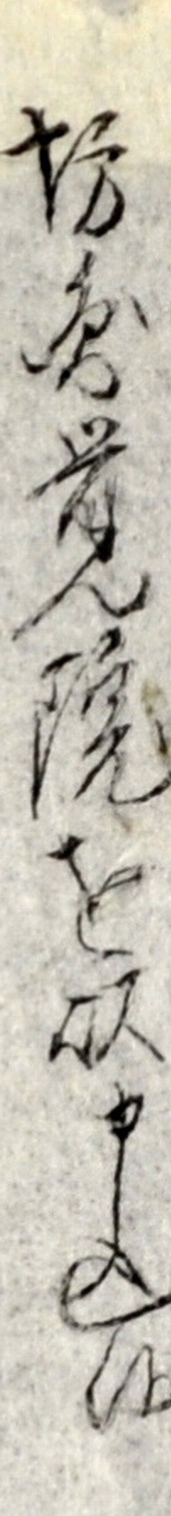坊圓覚院を以申込候
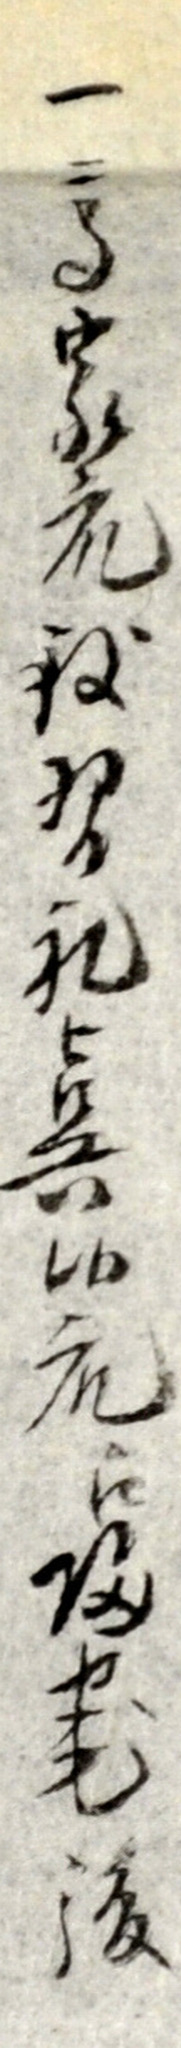一高家衆致習礼被呉候衆江帰宅後
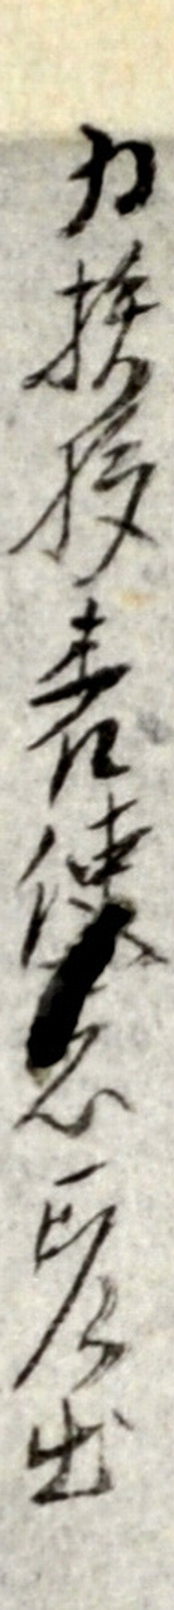為挨拶表使者差出
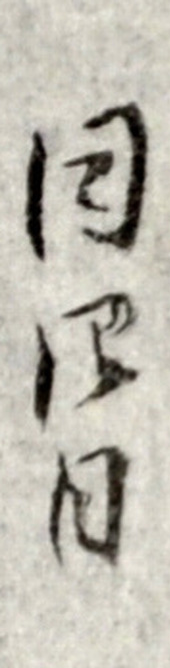同四月
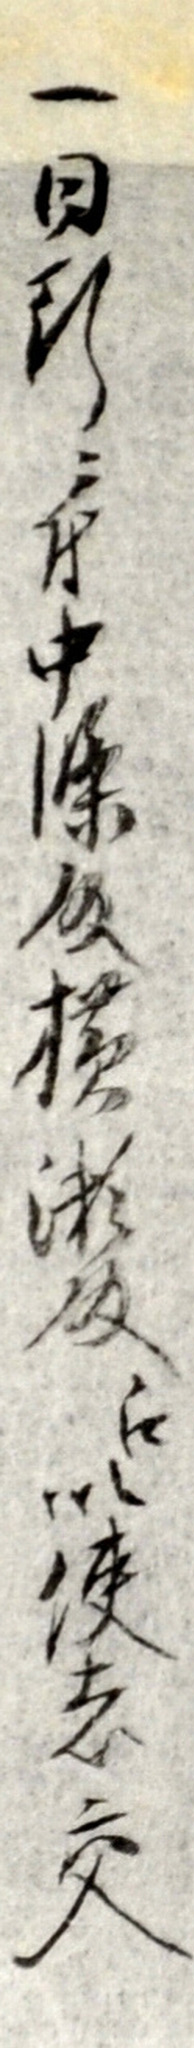一同断ニ付中條殿横瀬殿江御使者交
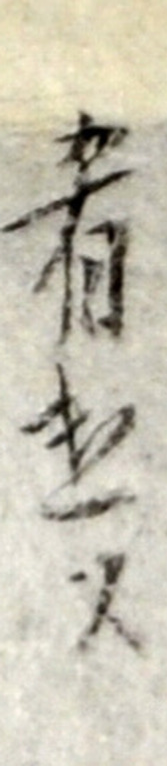肴遣ㇲ

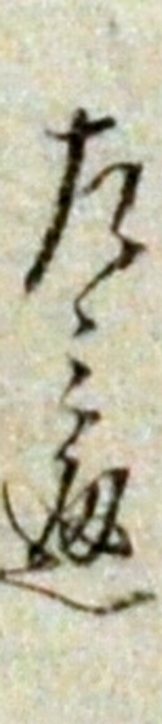左之通
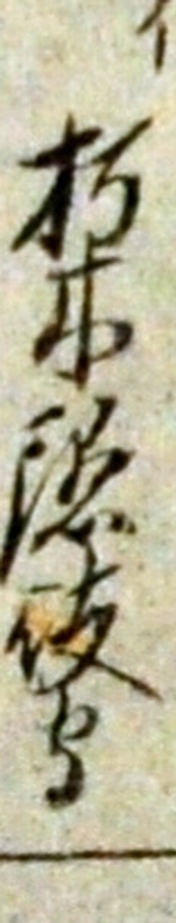朽木隠岐守
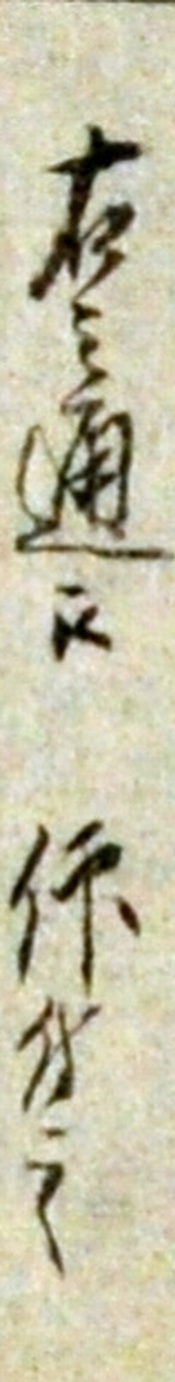右之通被仰付
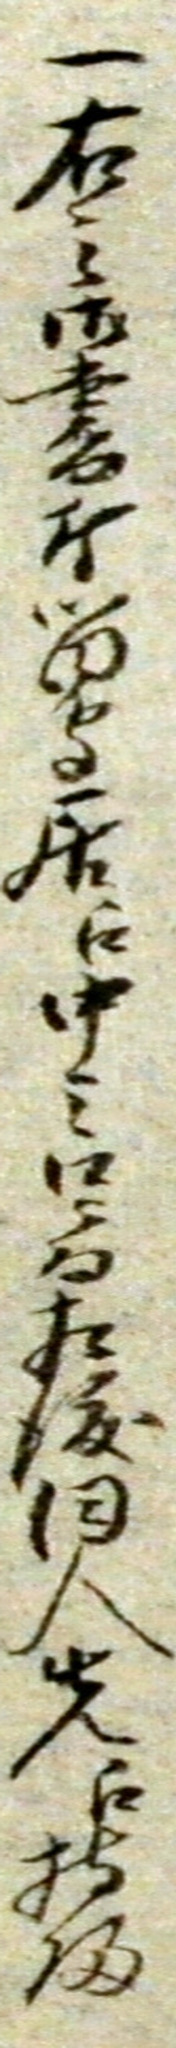一右之御書付留守居江中之口ニ而相渡同人先江持帰
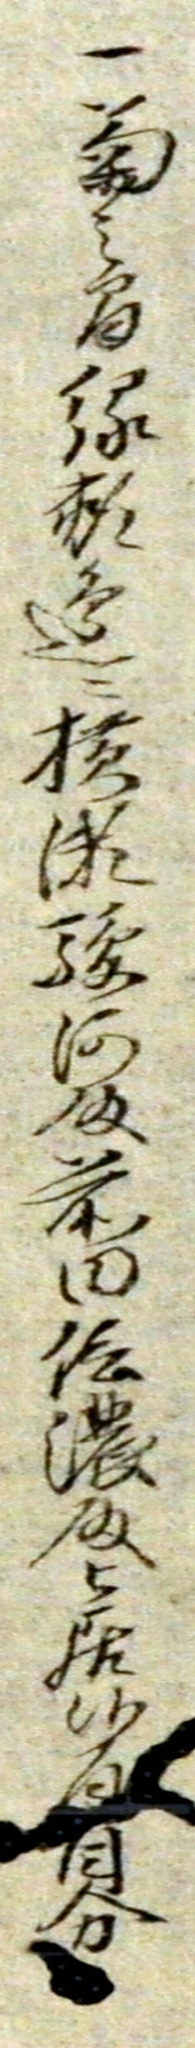一菊之間縁頬邊ニ横瀬駿河殿前田信濃守殿被居候間自分
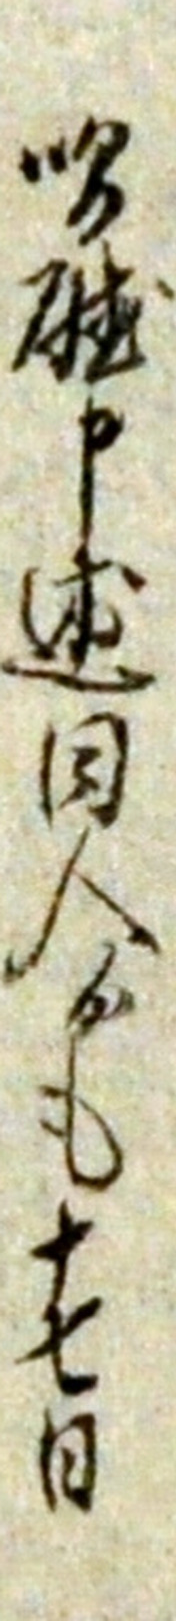吹聴申述同人ゟも十七日
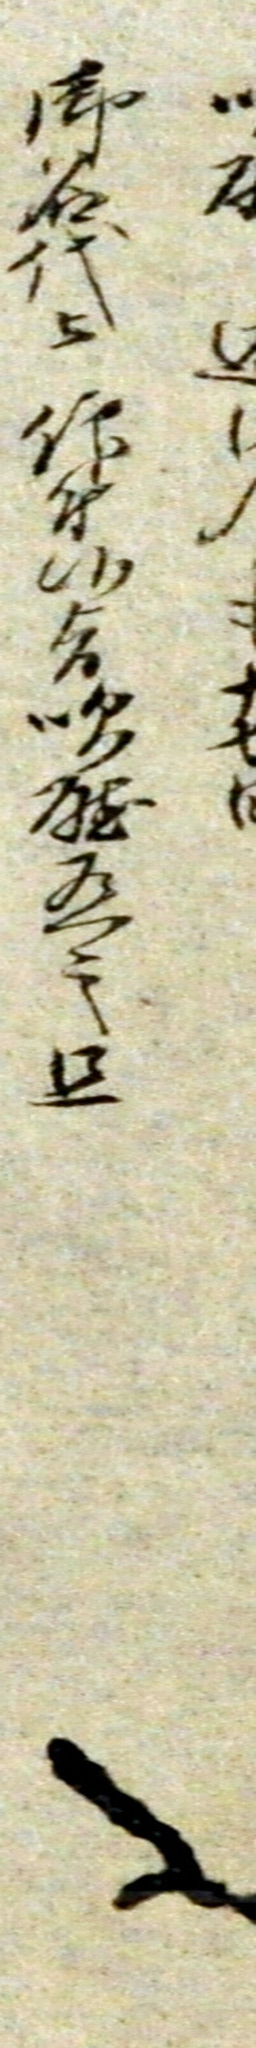御名代ヒ被仰付候旨吹聴有之且
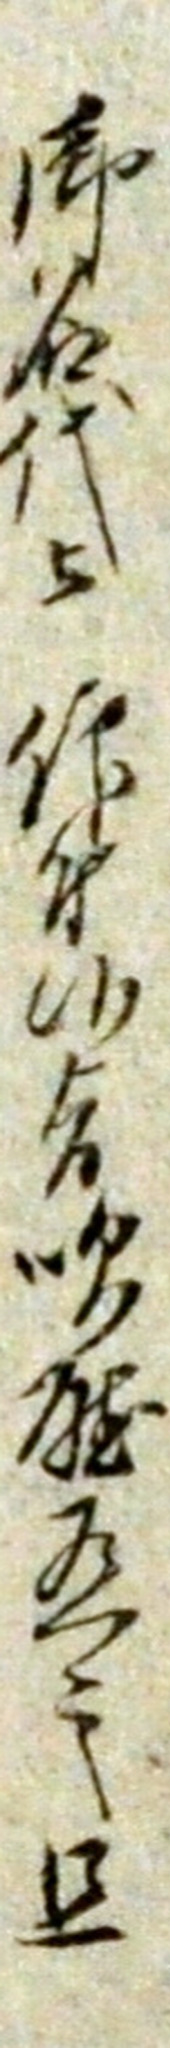御名代ヒ被仰付候旨吹聴有之且
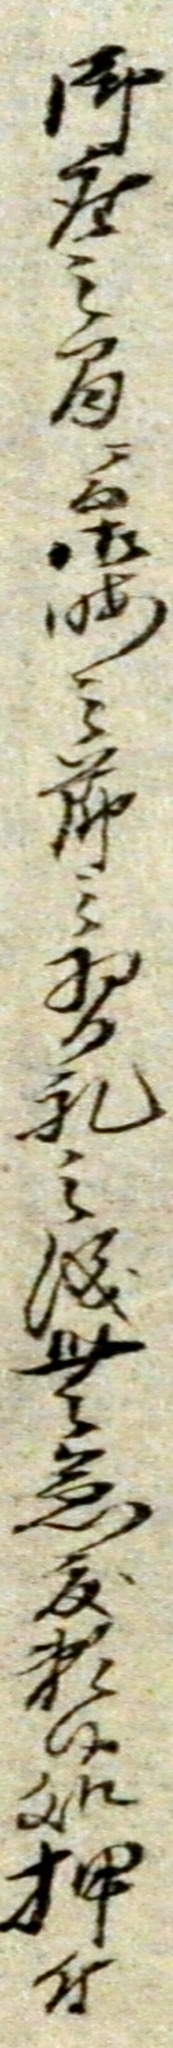御座之間ニ而御暇之節之習礼之儀無急度頼候処押付
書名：日光御名代相勤候節ノ留
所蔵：伊那市立高遠町図書館・合同会社AMANE
